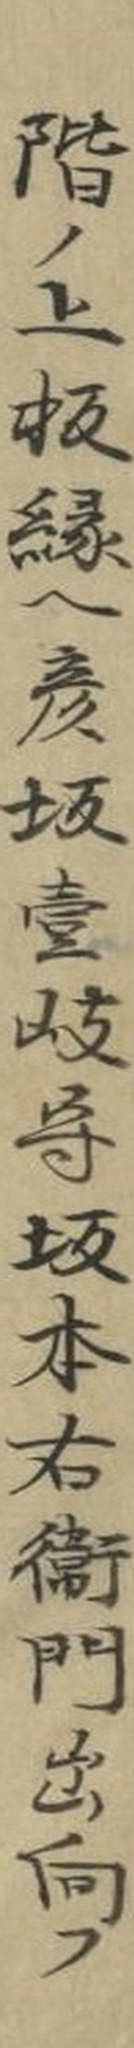階ノ上板縁へ彦坂壱岐守坂本右衛門出向フ
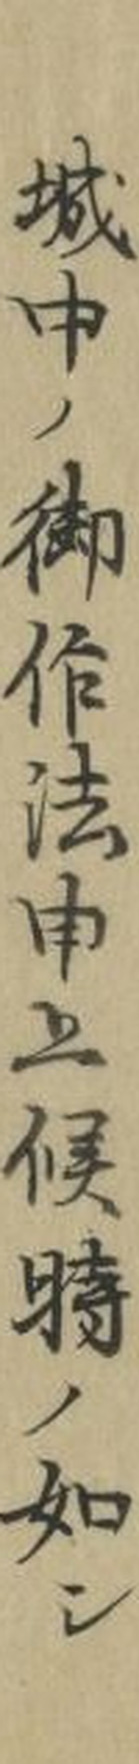城中ノ御作法申上候時ノ如シ
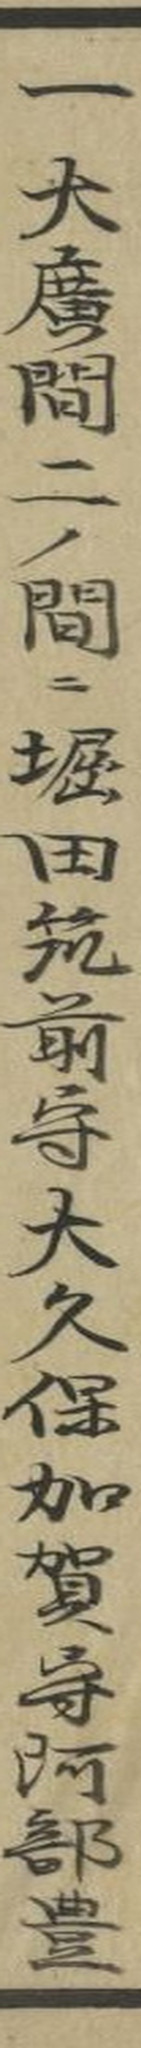一大広間二ノ間ニ堀田筑前守おお大久保加賀守阿部豊
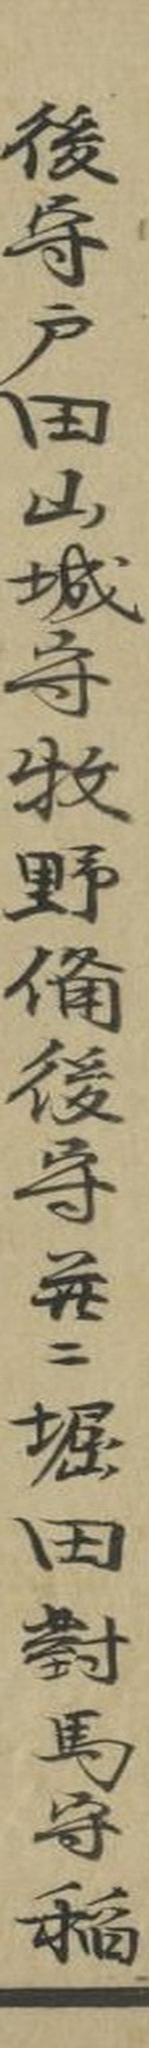後守戸田山城守牧野備後守并ニ堀田対馬守稲
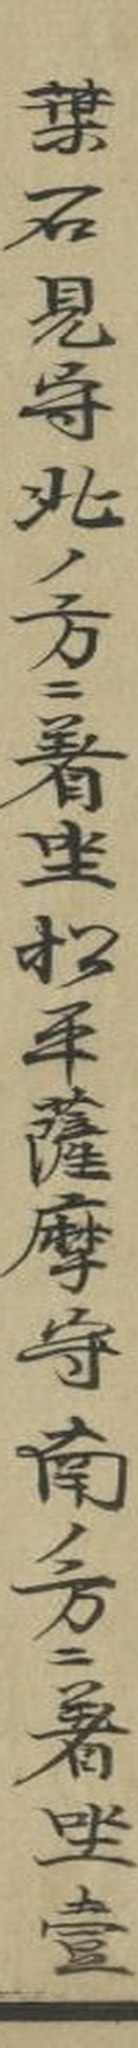葉石見守北ノ方ニ着座松平薩摩守南ノ方ニ着座壱
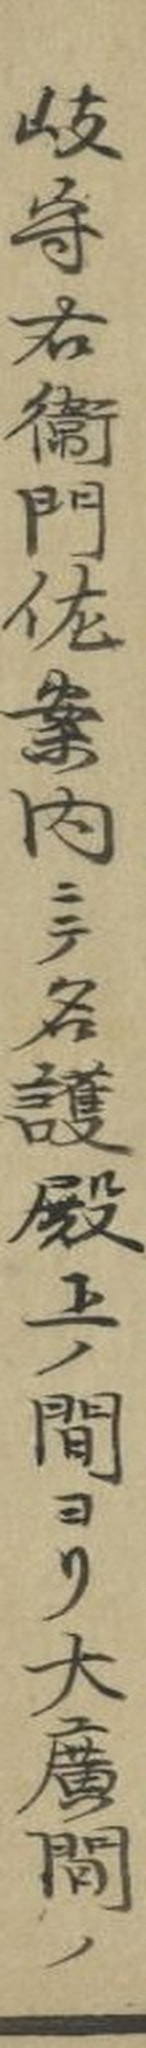岐守右衛門佑案内ニテ名護殿上ノ間ヨリ大広間ノ
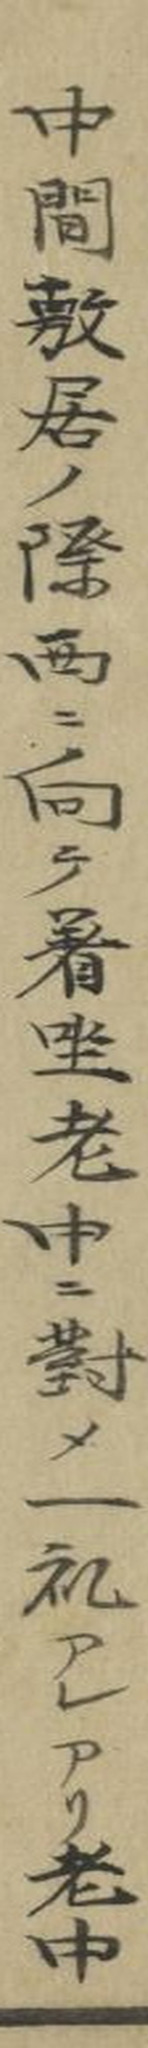中間敷居ノ際西ニ向テ着座老中ニ対メ一礼アレアリ老中
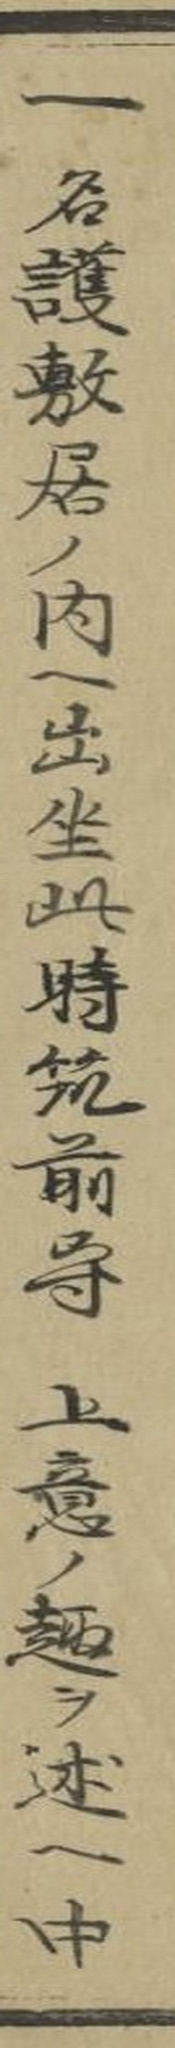一名護敷居ノ内ヘ出座此時筑前守上意ノ趣ヲ延ヘ中
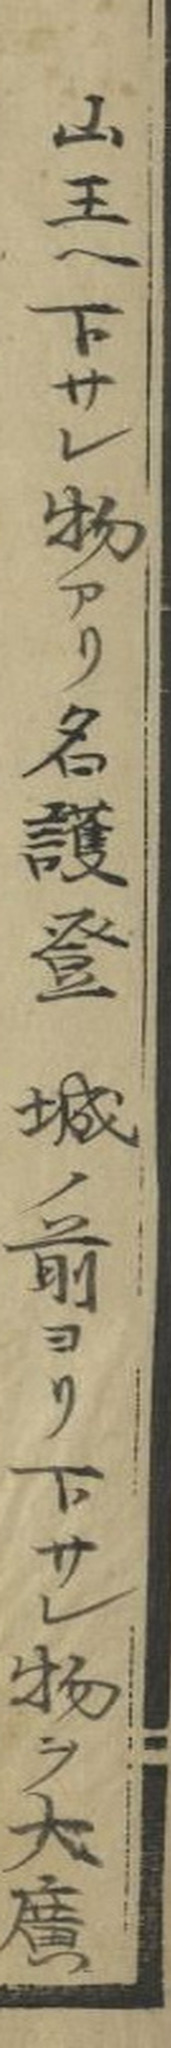山王へ下サレ物アリ名護登城ノ前ヨリ下サレ物ヲ大広
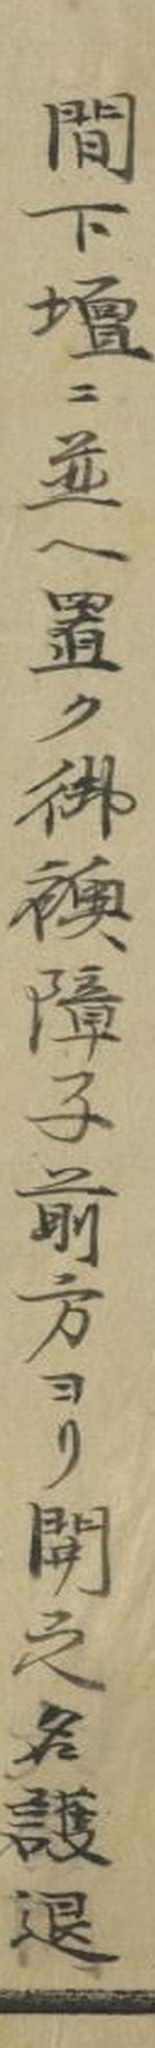間下壇ニ並へ置ク御襖障子前方ヨリ開之名護退
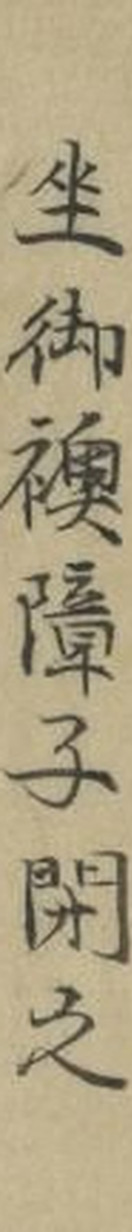座御襖障子閉之
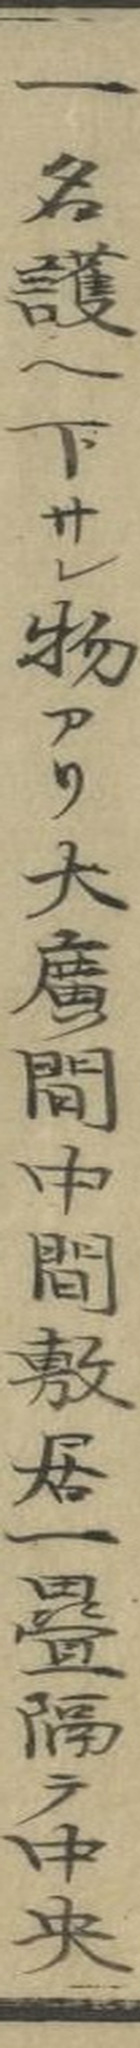一名護ヘ下サレ物アリ大広間中間敷居一畳隔テ中央
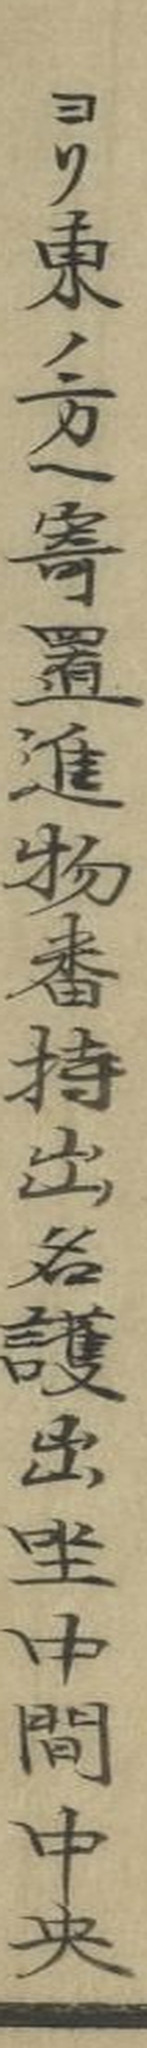ヨリ東ノ方へ寄置進物番持出名護出座中間中央
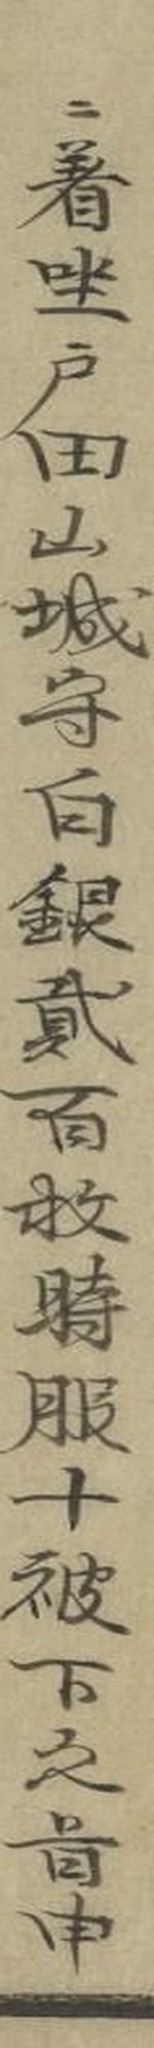ニ着座戸田山城守白銀弐百枚時服十被下之旨申
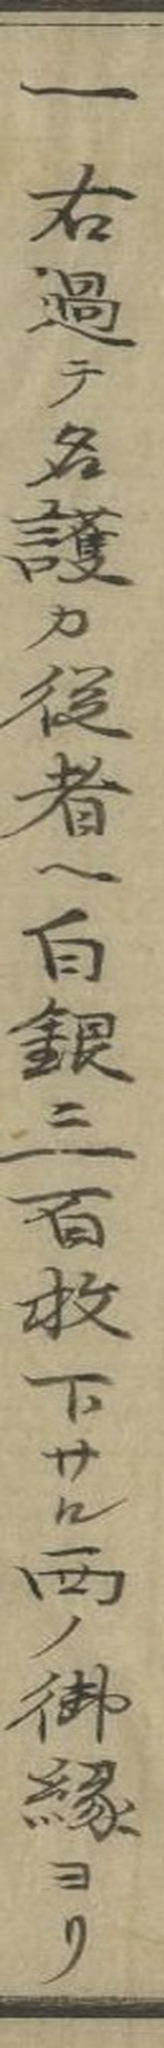一右過テ名護カ従者ヘ白銀三百枚下サル西ノ御縁ヨリ
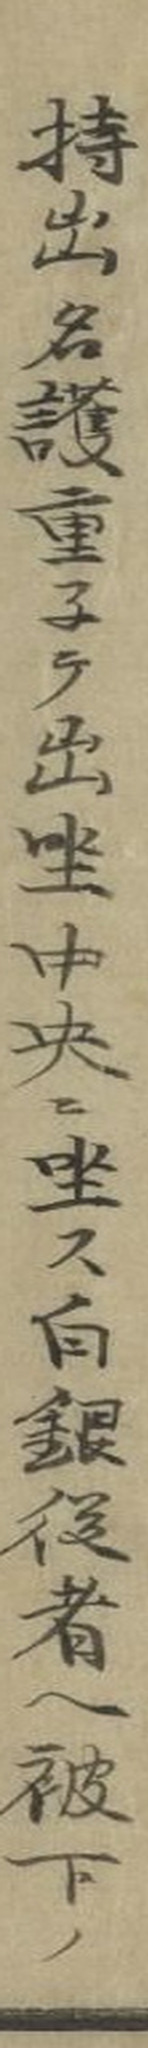持出名護重ネテ出座中央ニ座ス白銀従者ヘ被下ノ
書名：琉球往来（下）
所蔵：University of the Ryukyus Library
